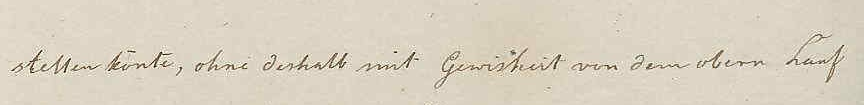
stellen könte, ohne deshalb mit Gewisheit von dem obern Lauf
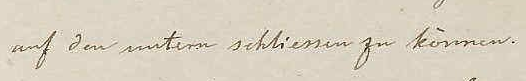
auf den untern schliessen zu können.
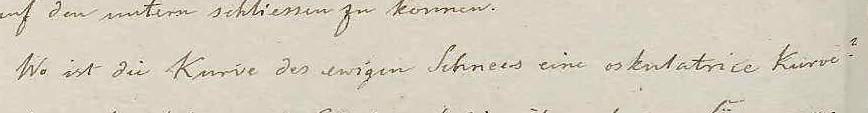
Wo ist die Kurve des ewigen Schnees eine oskulatrice Kurve?
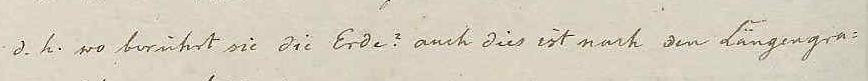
d. h. wo berührt sie die Erde? auch dies ist nach den Längengra-
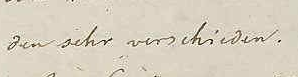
den sehr verschieden.
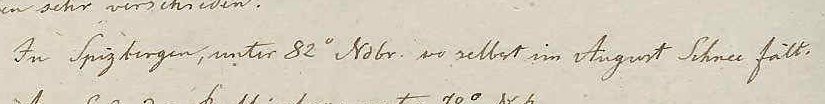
In Spizbergen, unter 82° Ndbr. wo selbst im August Schnee fält.
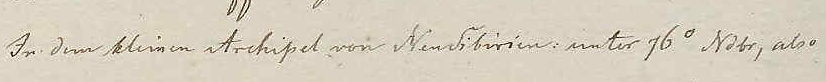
In dem kleinen Archipel von NeuSibirien: unter 76° Ndbr, also
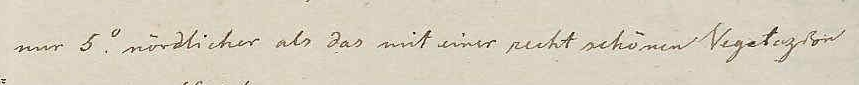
nur 5° nördlicher als das mit einer recht schönen Vegetazion
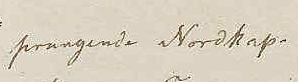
prangende Nordkap.
